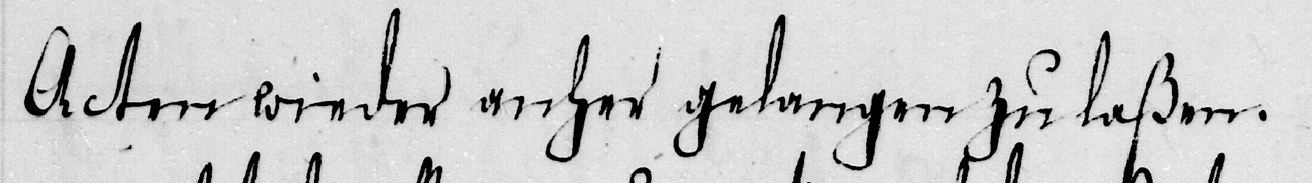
Acten wieder anher gelangen zu laßen.
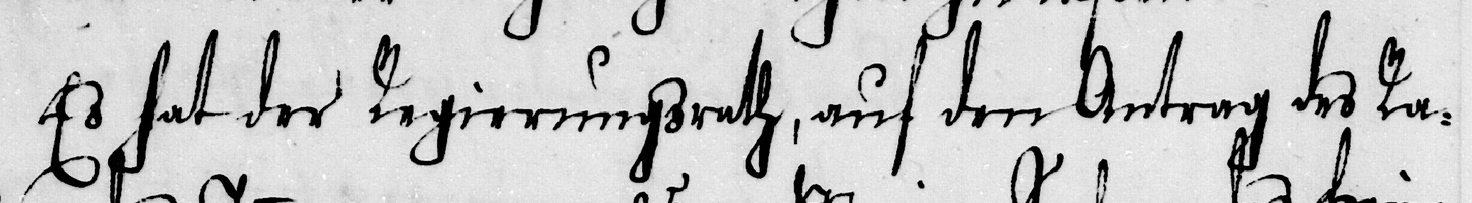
Es hat der Regierungsrath, auf den Antrag des Rat¬
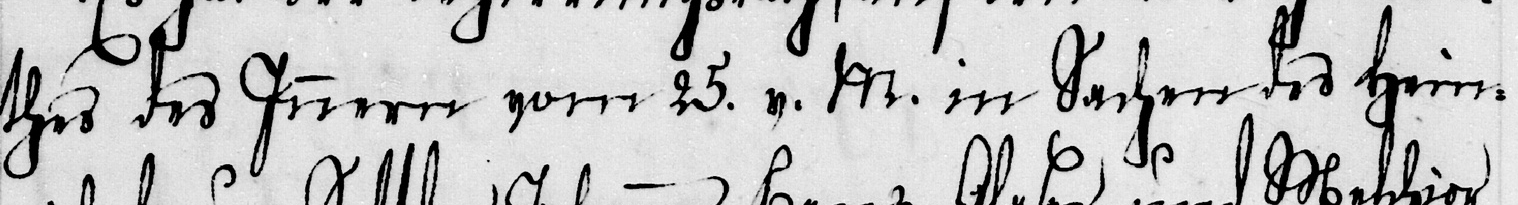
hes des Innern vom 25. v. M. in Sachen des Hein¬
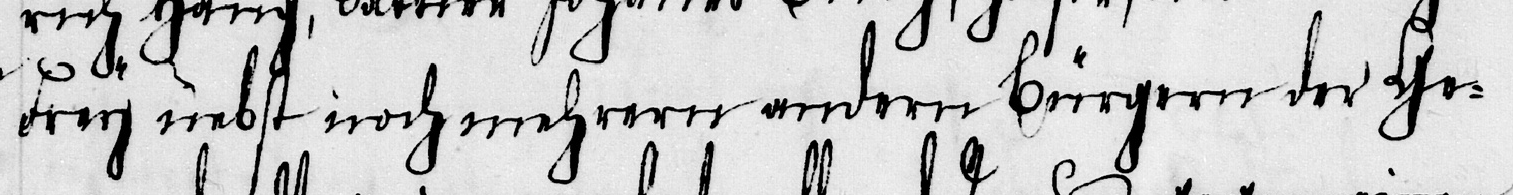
Frey nebst noch mehrern andern Bürgern der Ge¬
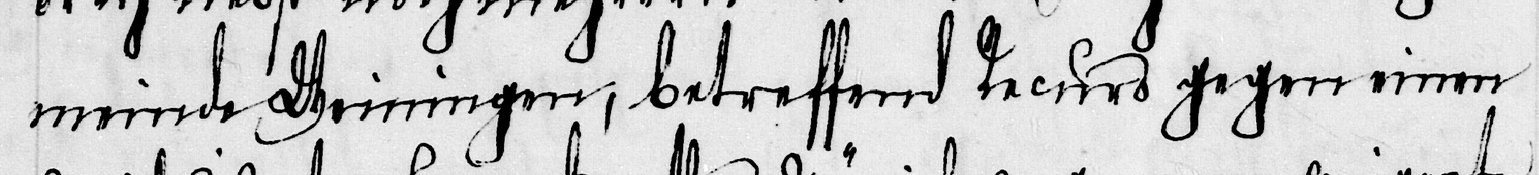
meinde Weiningen, betreffend Recurs gegen einen
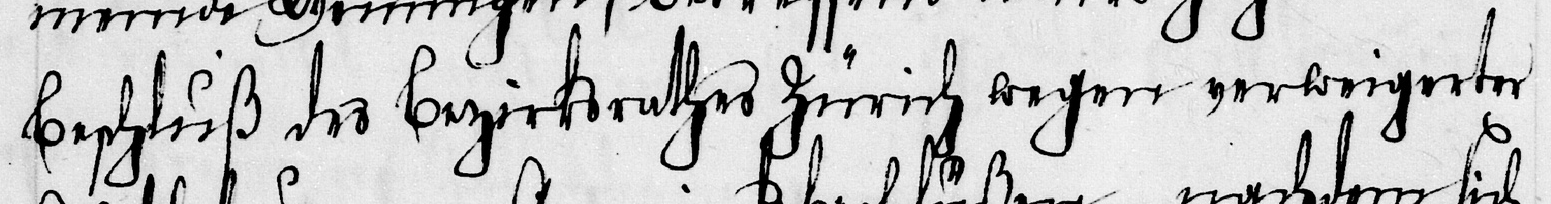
Beschluß des Bezirksrathes Zürich wegen verweigerter
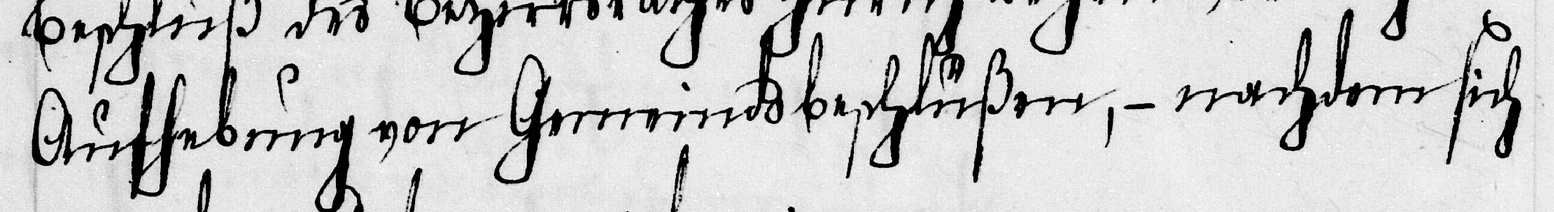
Aufhebung von Gemeindsbeschlüßen,– nachdem sich
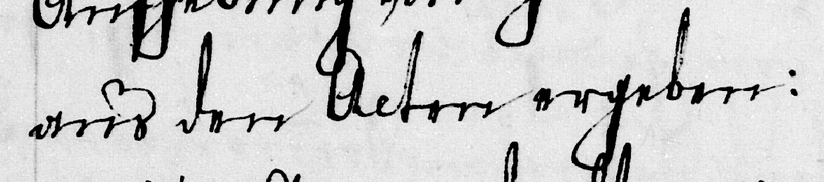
aus den Acten ergeben:
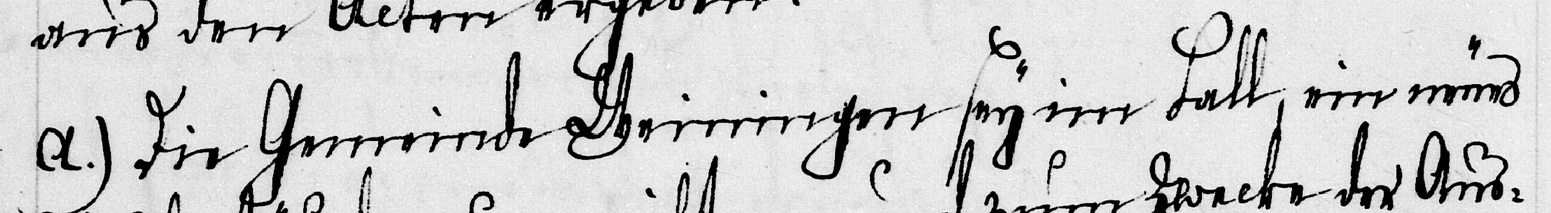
A.) Die Gemeinde Weiningen sey im Fall, ein neues
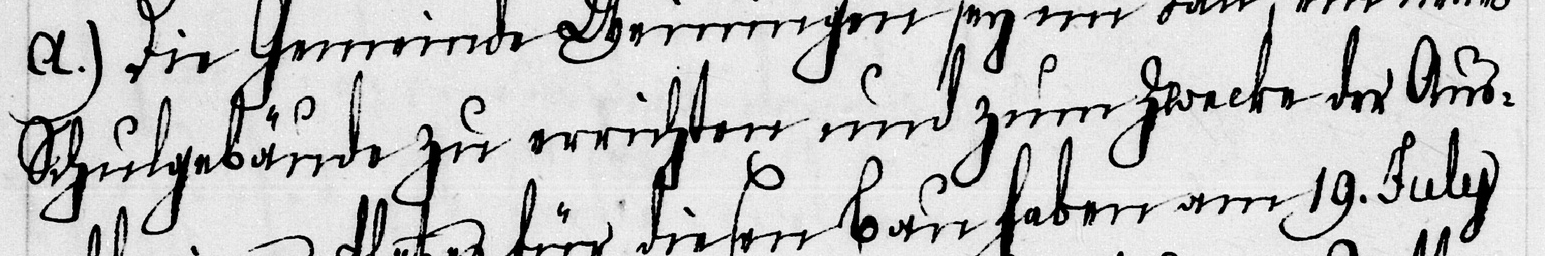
Schulgebäude zu errichten und zum Zwecke der Aus¬
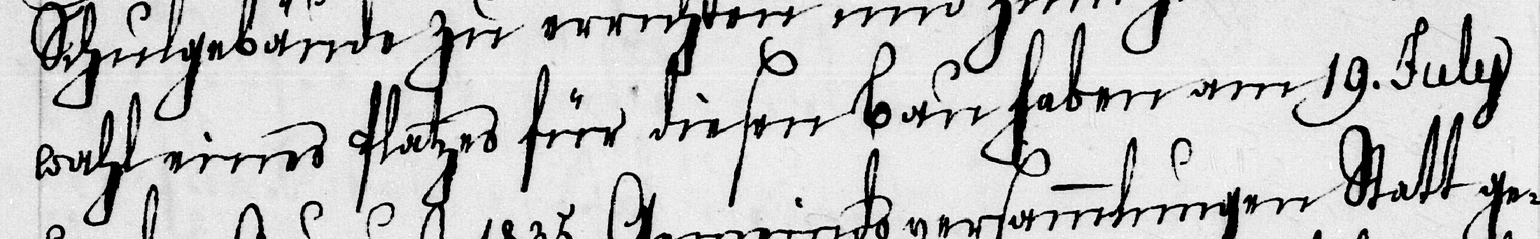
wahl eines Platzes für diesen Bau haben am 19. July
